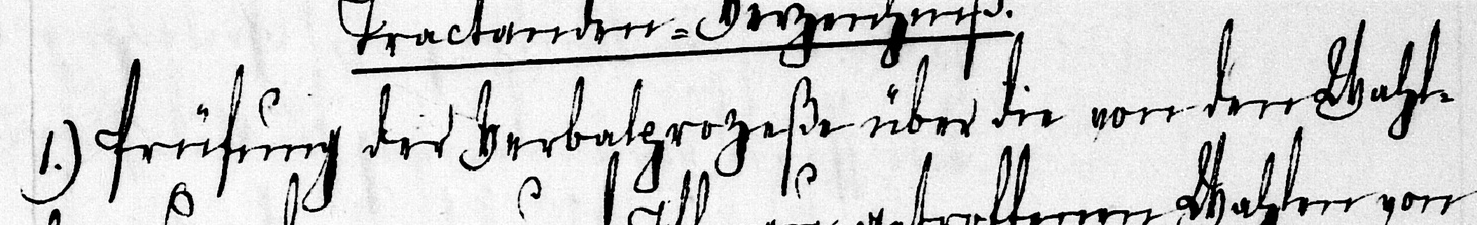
1.) Prüfung der Verbalprozeße über die von den Wahl¬
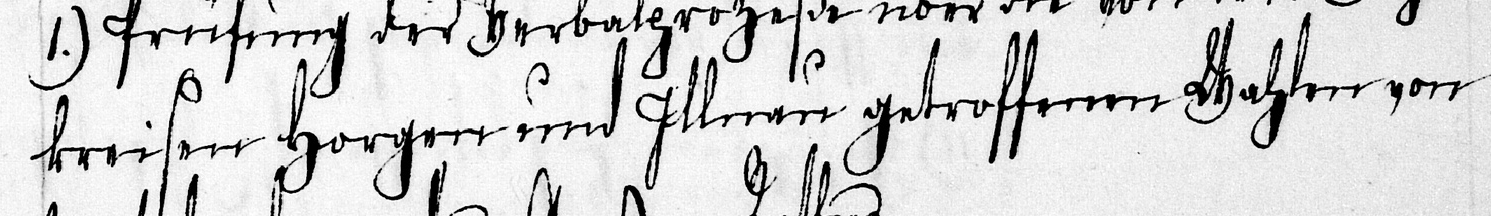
kreisen Horgen und Illnau getroffenen Wahlen von
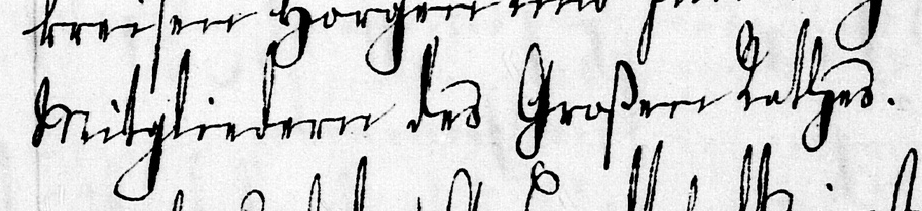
Mitgliedern des Großen Rathes.
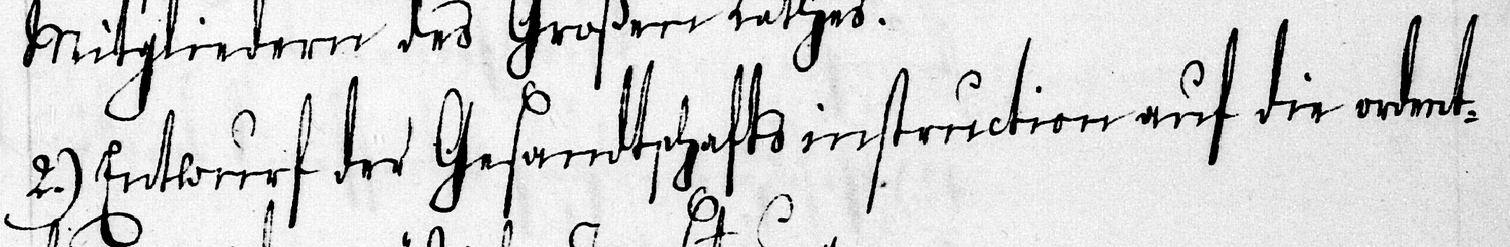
2.) Entwurf der Gesandtschaftsinstruction auf die orden¬
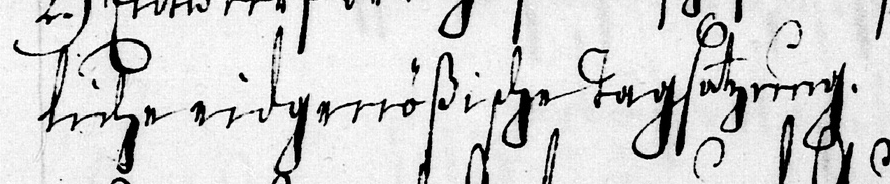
tliche eidgenößische Tagsatzung.
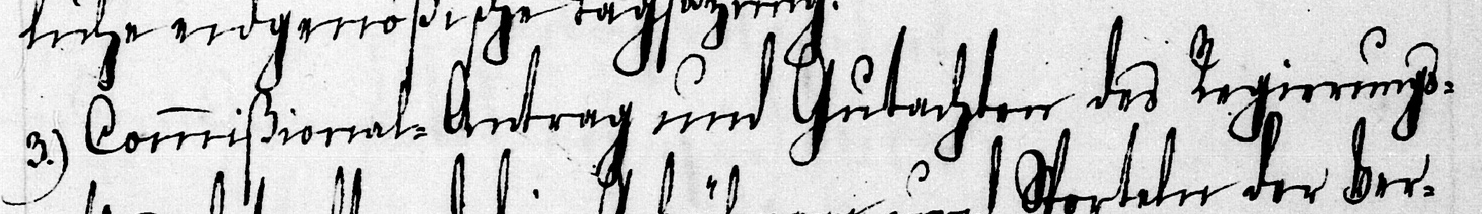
3.) Commißional-Antrag und Gutachten des Regierungs¬
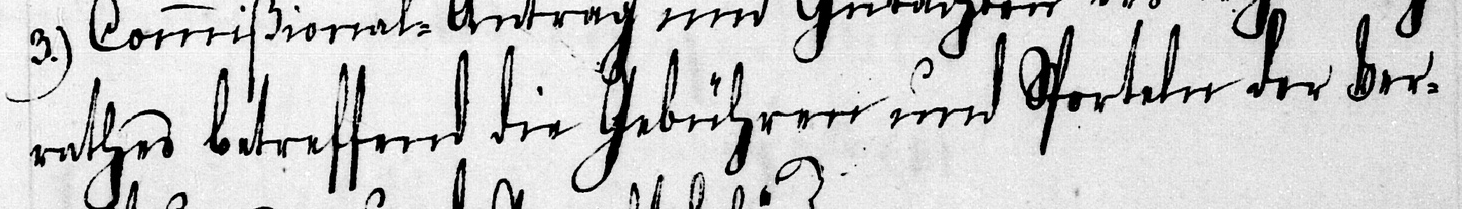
rathes betreffend die Gebühren und Sporteln der Ver¬
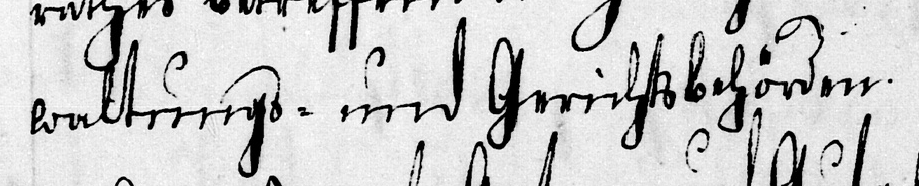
waltungs- und Gerichtsbehörden.
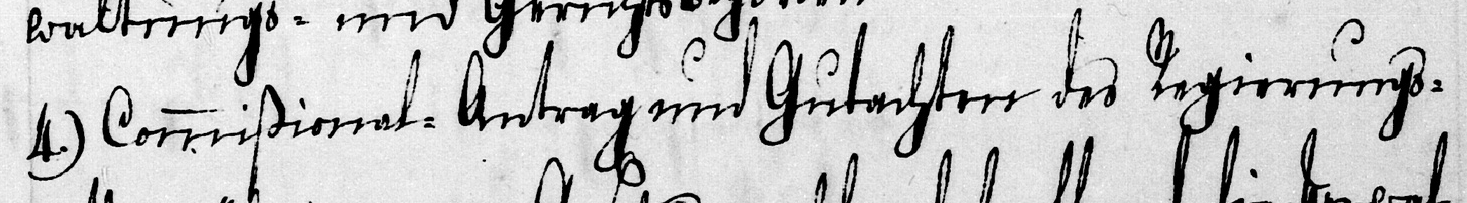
4.) Commißional-Antrag und Gutachten des Regierungs¬
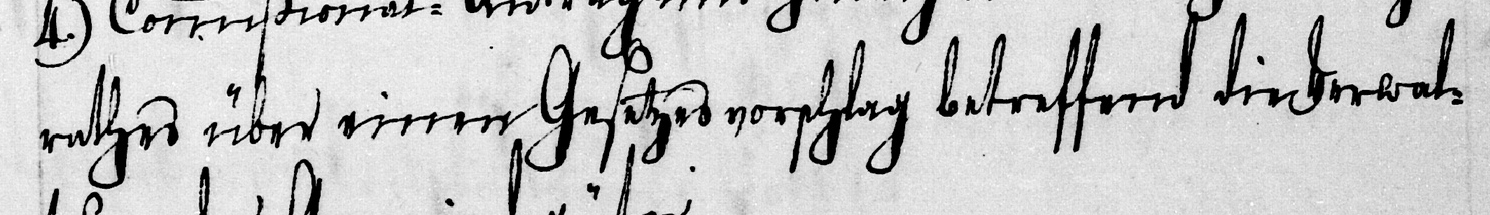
rathes über einen Gesetzesvorschlag betreffend die Verwal¬
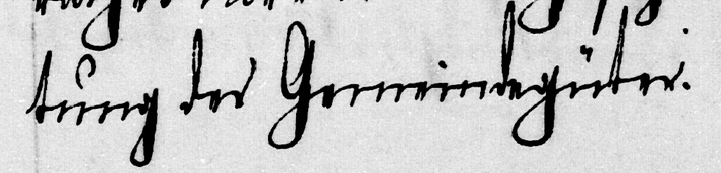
tung der Gemeindegüter.
